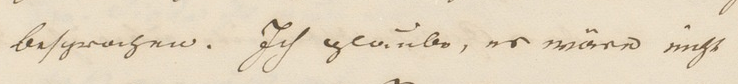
besprochen. Ich glaube, es wäre nicht
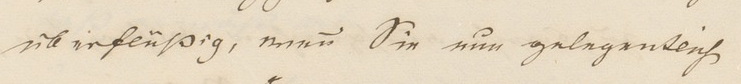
überflüßig, wenn Sie nun gelegentlich
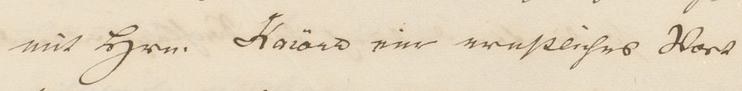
mit Hrn. Knörr ein ernstliches Wort
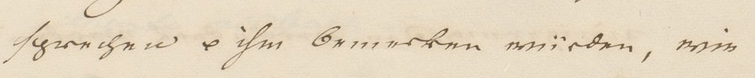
sprechen & ihm bemerken würden, wie
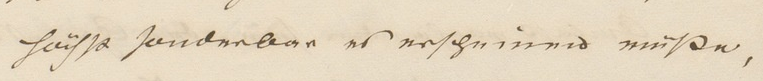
höchst sonderbar es erscheinen müße,
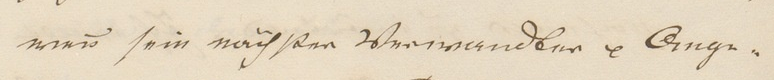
wenn sein nächster Verwandter & Ange-
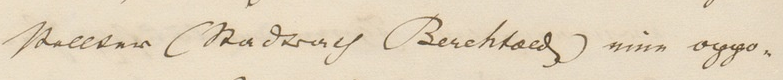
stellter (Stadtrath Berchtold) eine oppo-
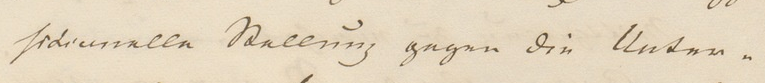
sitionelle Stellung gegen die Unter-
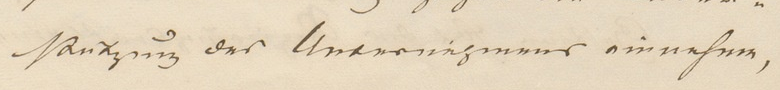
stützung des Unternehmens einnehme,
